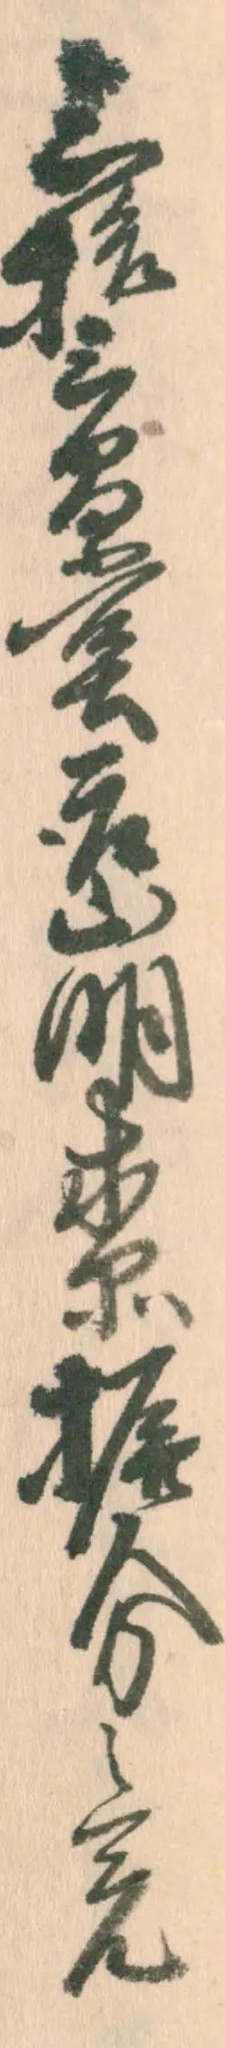三拾三間堂取崩木品拼分之覚
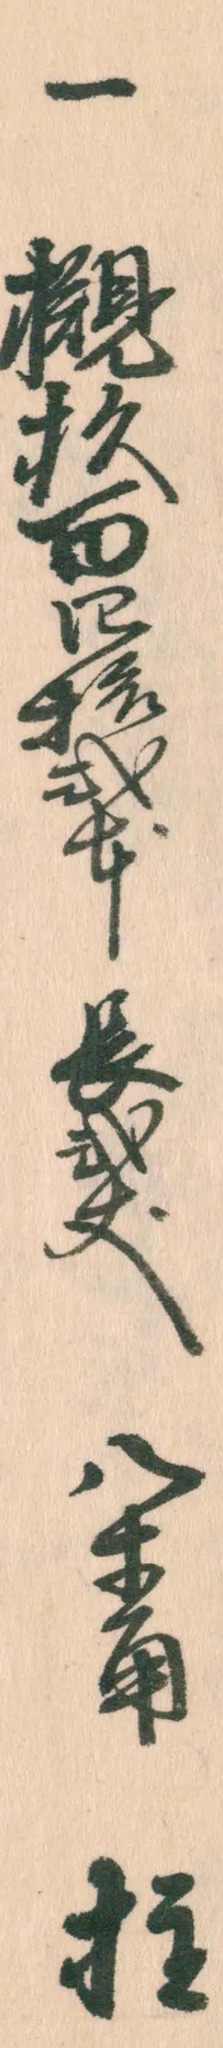一槻杉百四拾弐本長弐丈八寸角柱
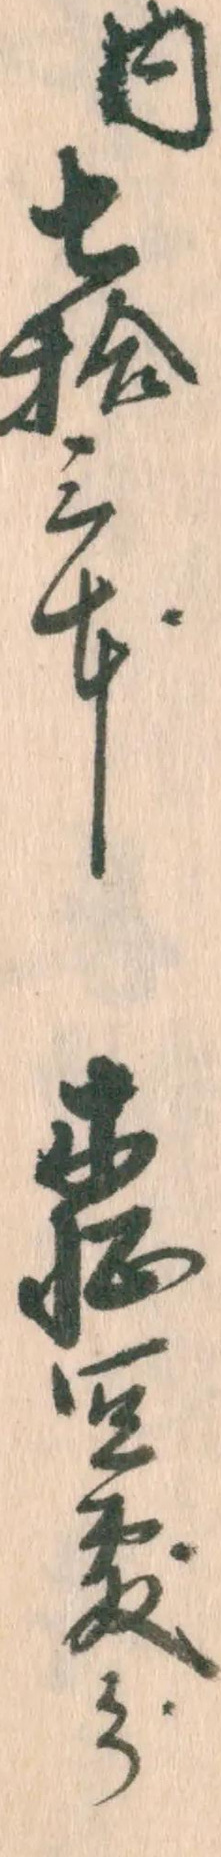内七拾三本木怔宜敷分

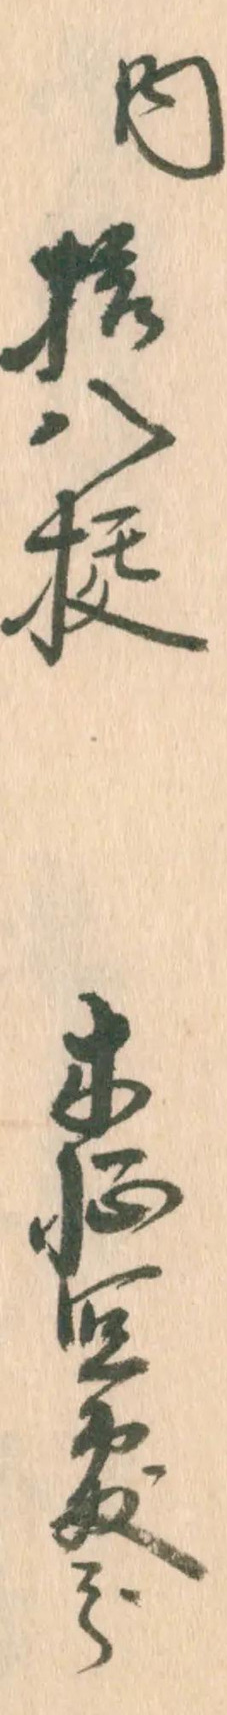内拾八挺木怔宜敷分
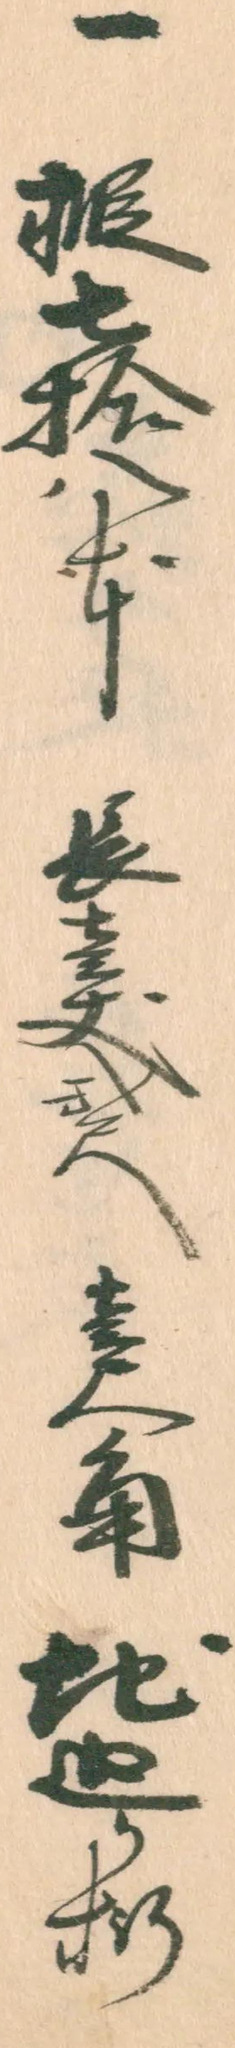一榧七拾八本長壱丈弐尺壱尺角地廻り桁
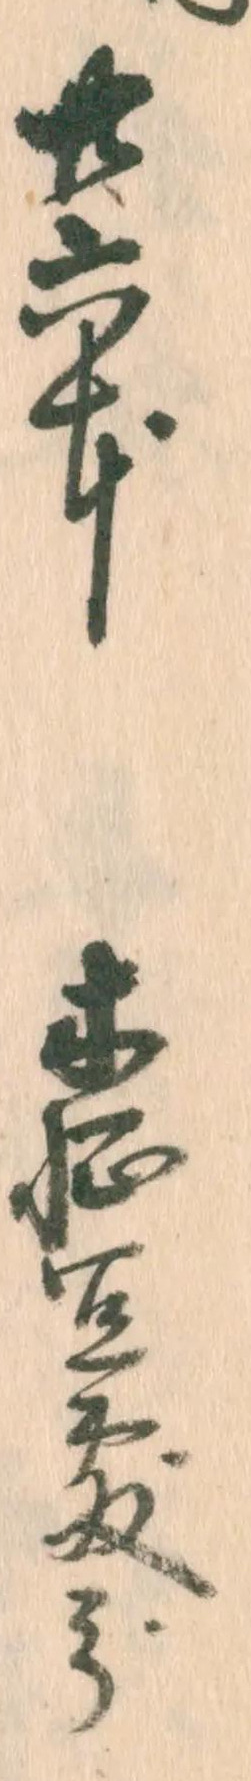内廿六本木怔宜敷分
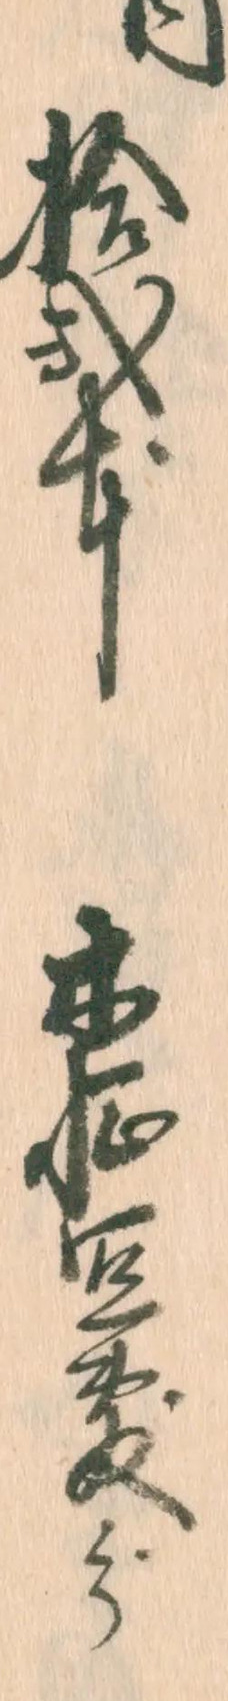内拾弐本木怔宜敷分
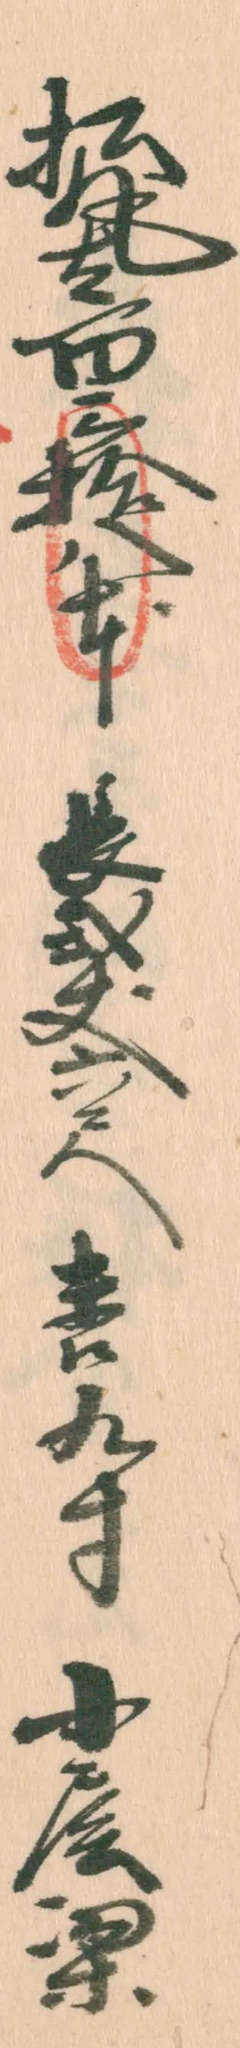一松丸太百六十四本長弐丈六尺末口九寸小屋梁
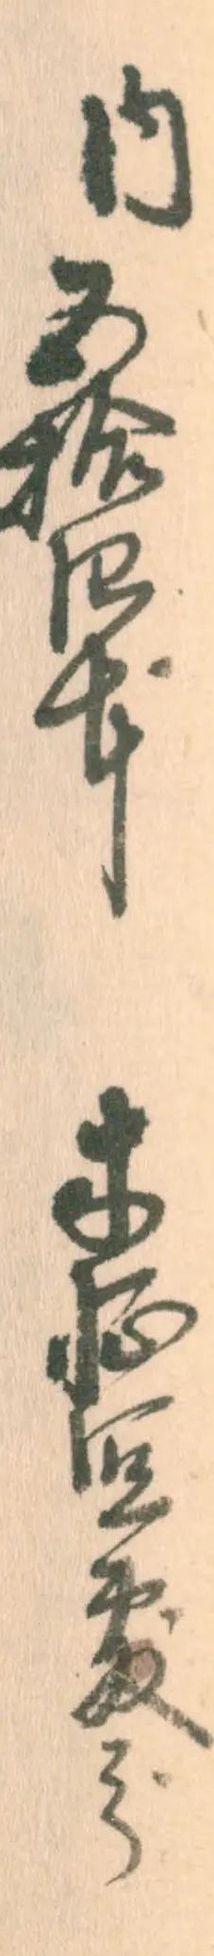内五拾四本木怔宜敷分
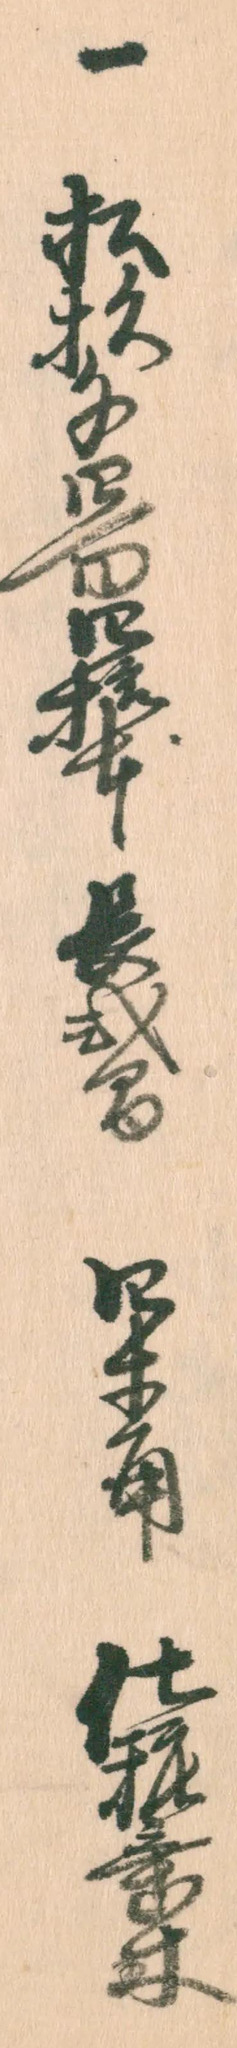一松杉千四百四拾本長弐間四寸角化粧垂木
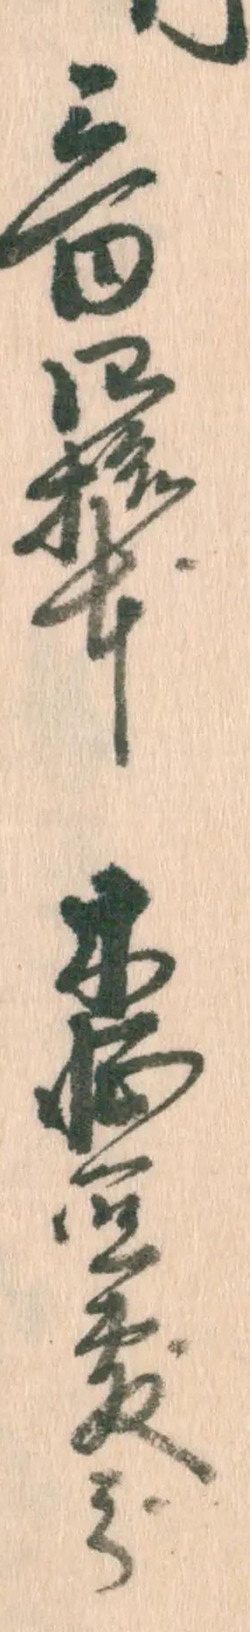内三百四拾本木怔宜敷分
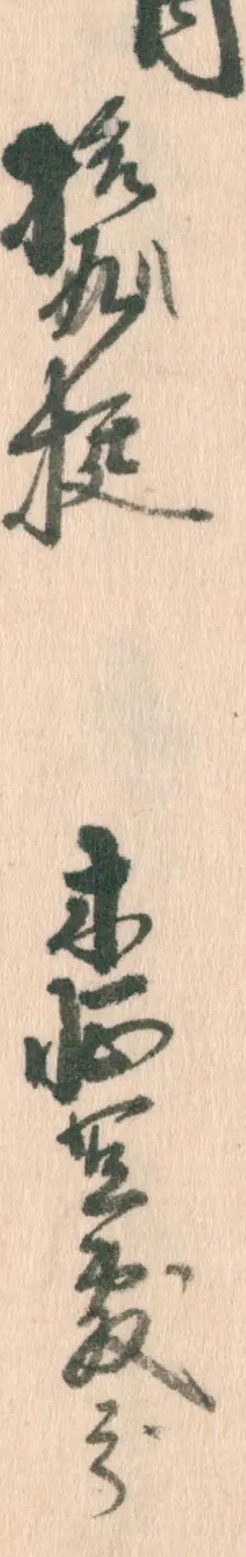内拾八挺木怔宜敷分
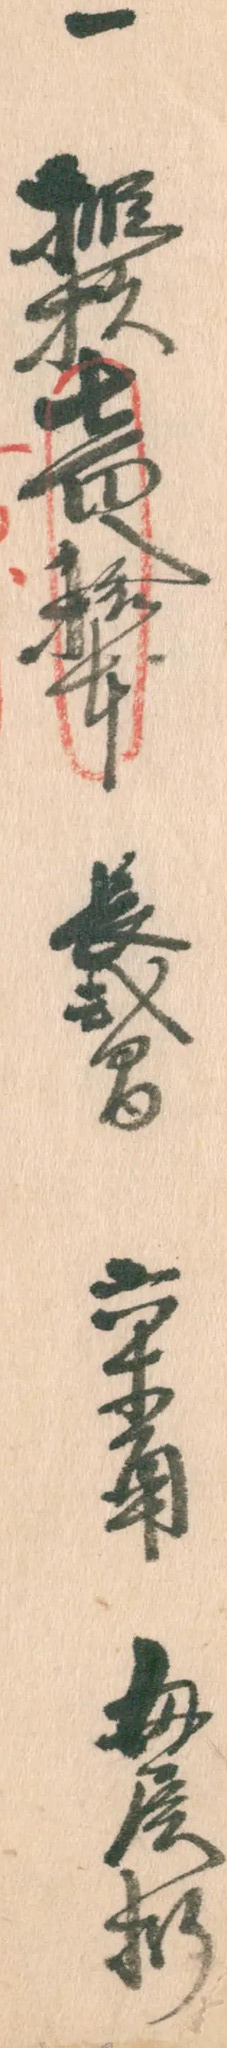一榧杉九百本長弐間六寸角母屋桁

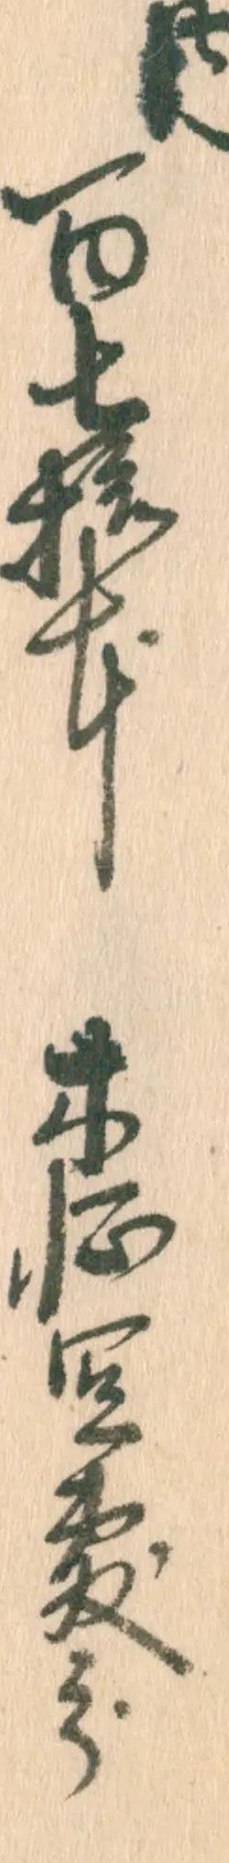内百七拾本木怔宜敷分
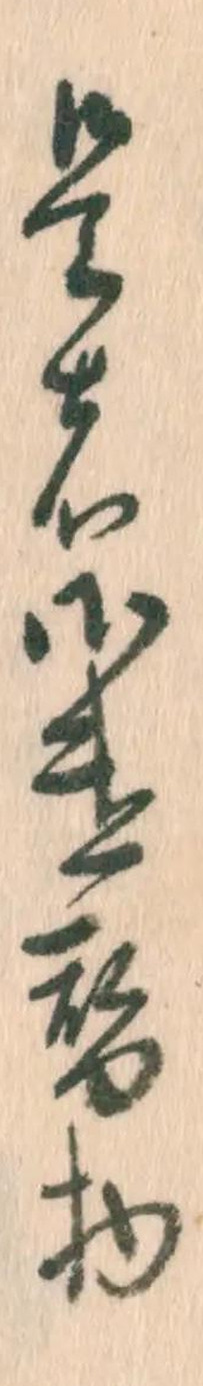是は御遣替物
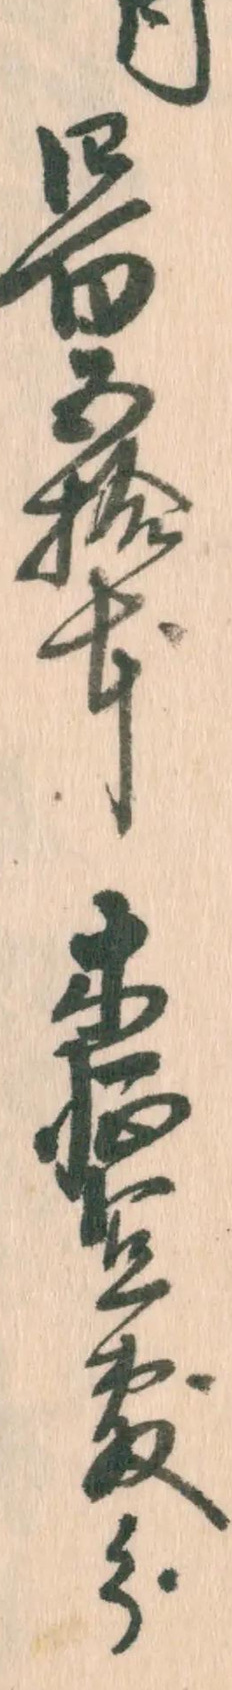内四百五拾本木怔宜敷分
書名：三十三間堂. [2]
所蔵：国立国会図書館 National Diet Library, JAPAN
